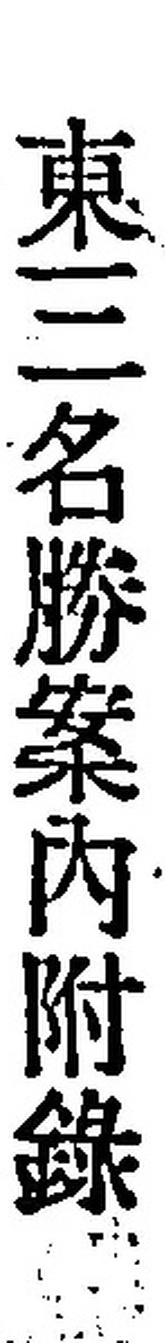東三名勝案内附録
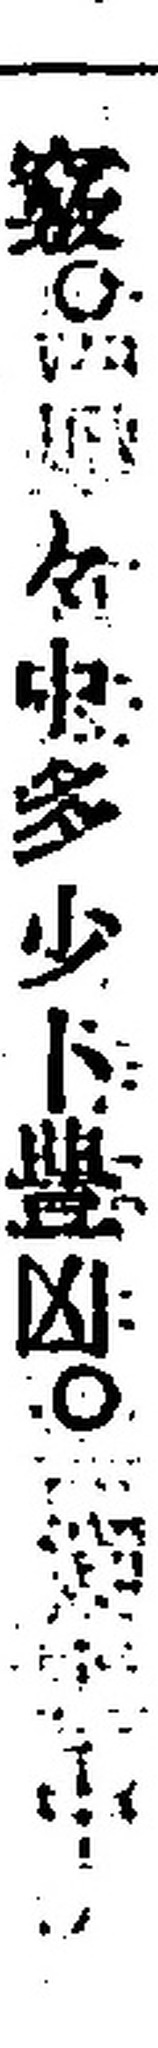竅。々中多少卜豊凶。
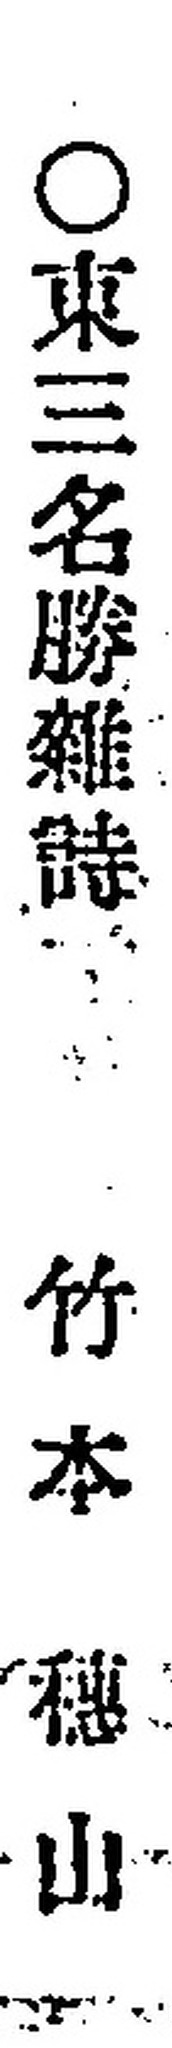〇東三名勝雑詩竹本穂山
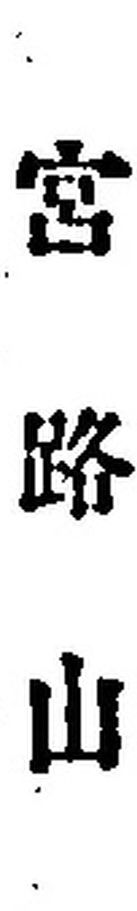宮路山
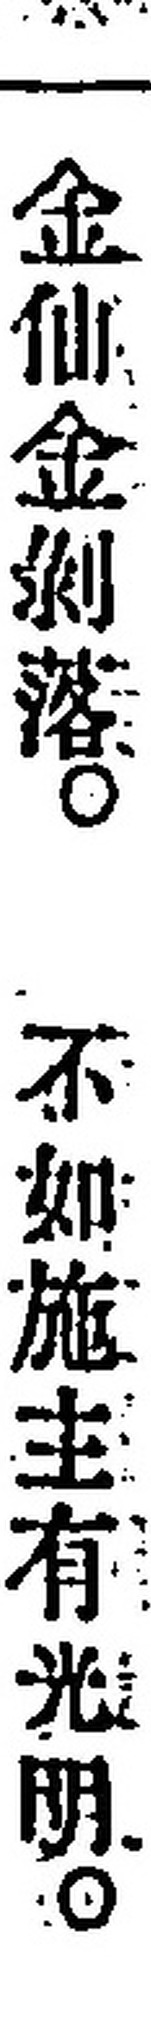金仙金剥落。不如施主有光明。
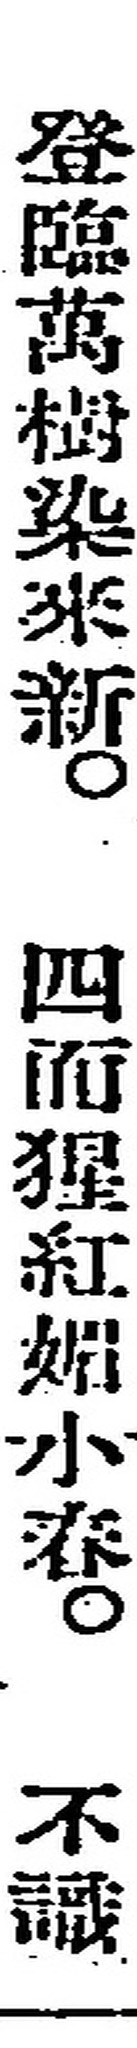登臨萬樹染来新。四面猩紅媚小春。不識
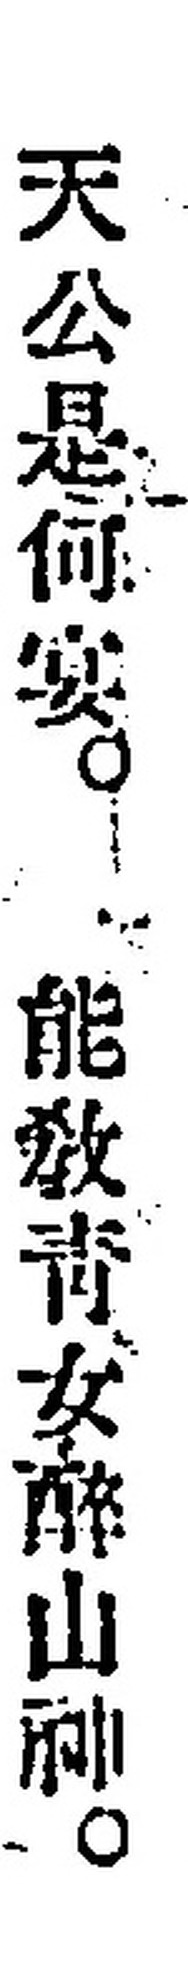天公是何宴。能教青女酔山神。
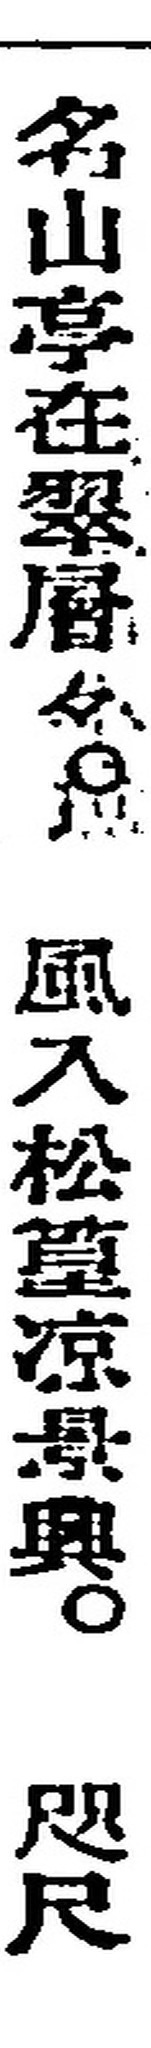名山亭在翠層々。風入松篁涼景興。咫尺
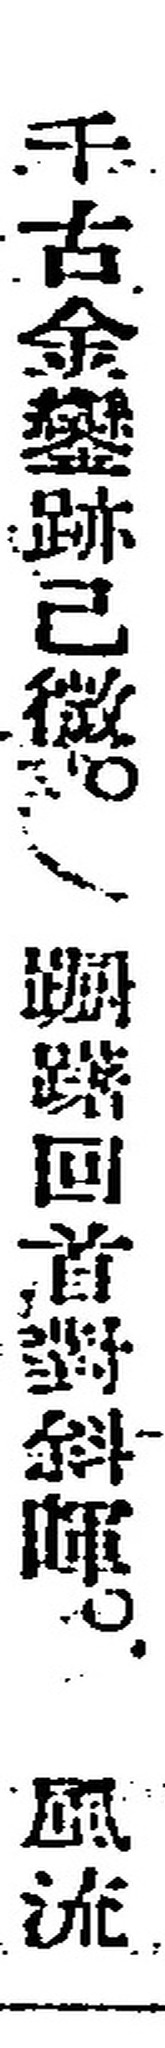千古金鑾跡己徴。蹰躇回首対斜暉。風流
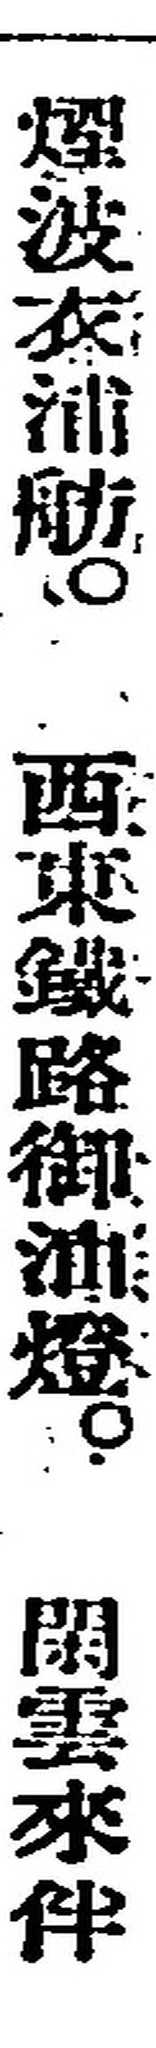煙波衣浦舫。西東鉄路御油燈。閑雲来伴
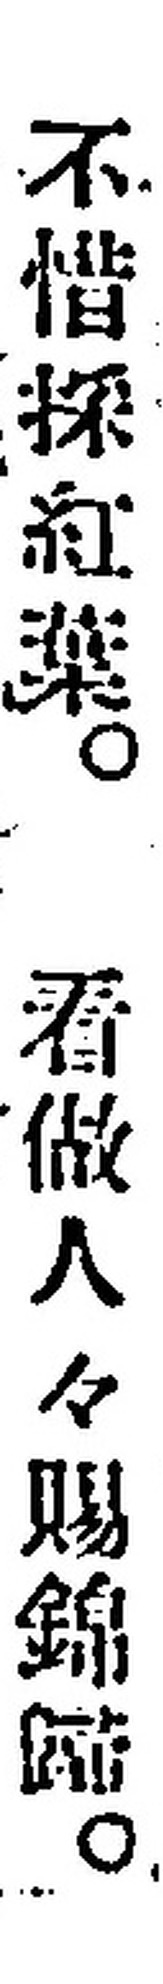不惜採紅葉。看做人々賜錦歸。
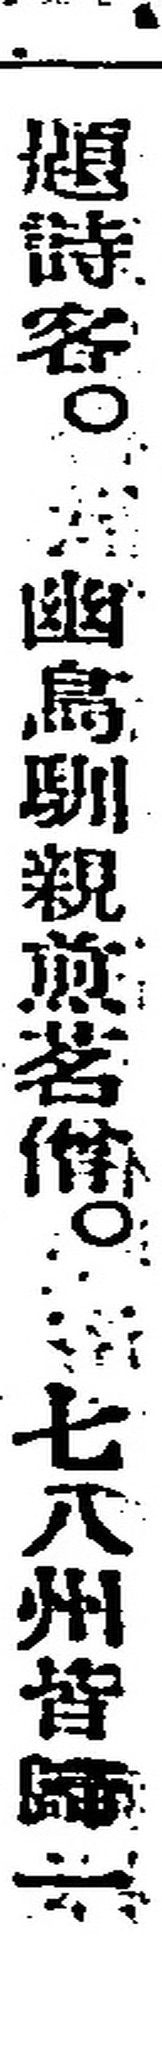題詩客。幽鳥馴親煎茗僧。七八州皆帰一
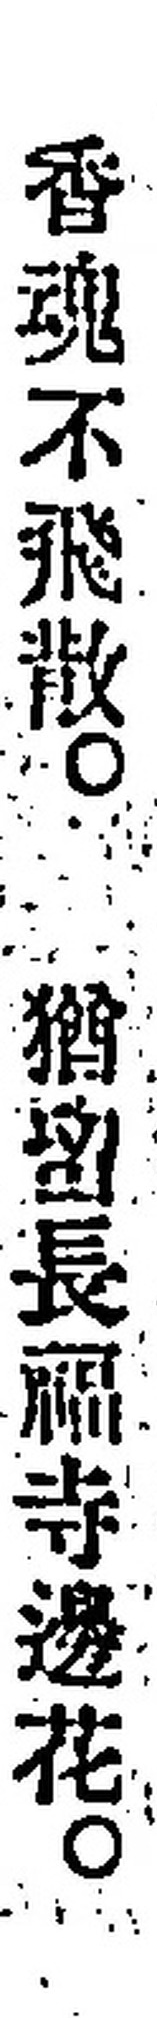香魂不飛散。猶留長福寺邊花。
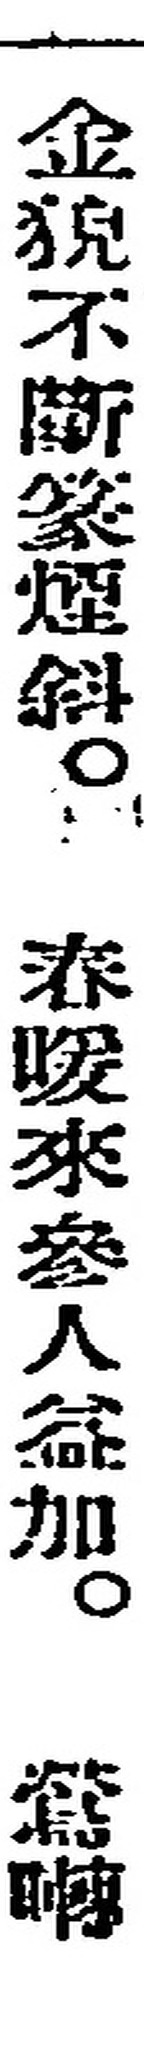金猊不断篆煙斜。春暖来参人益加。鶯囀
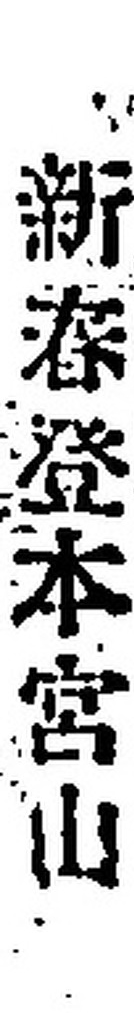新春登本宮山
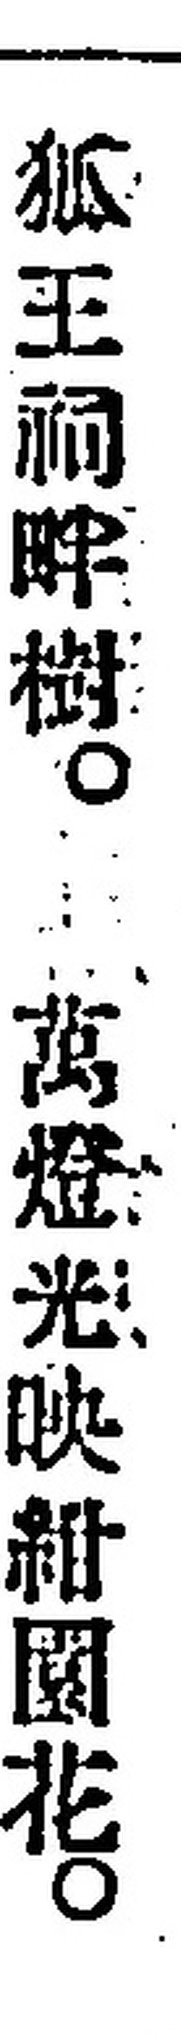狐王祠畔樹。万燈光映紺園花。
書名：東参名勝案内
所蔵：国立国会図書館 National Diet Library, JAPAN
